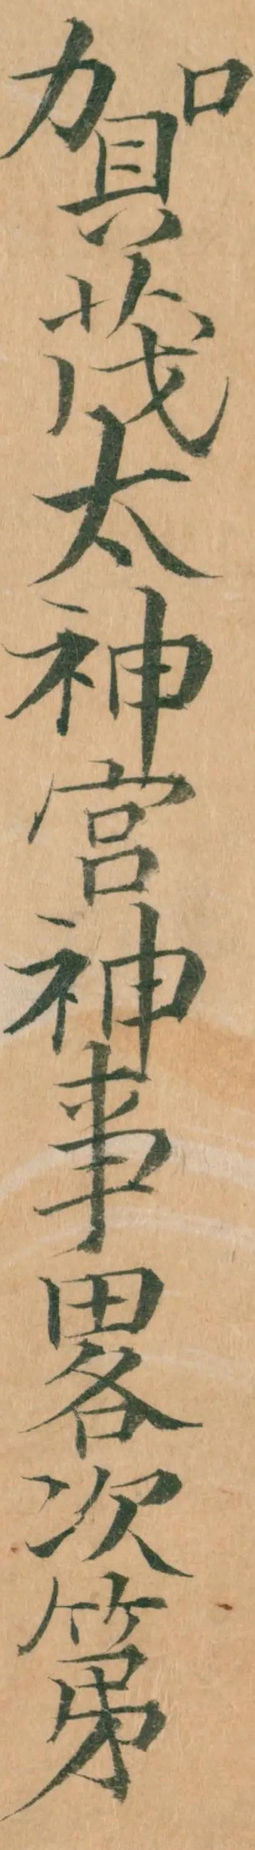賀茂太神宮神事略次第

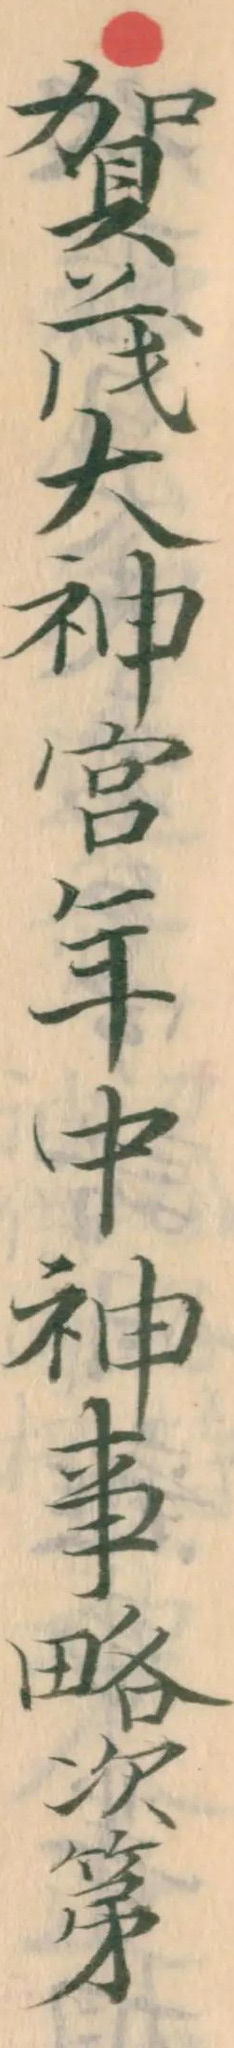●賀茂大神宮年中神事略次第
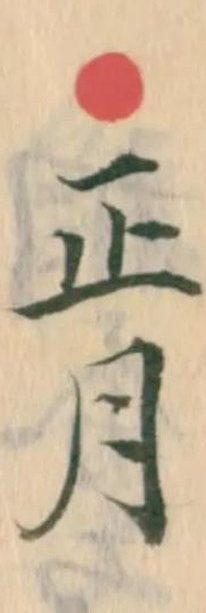●正月
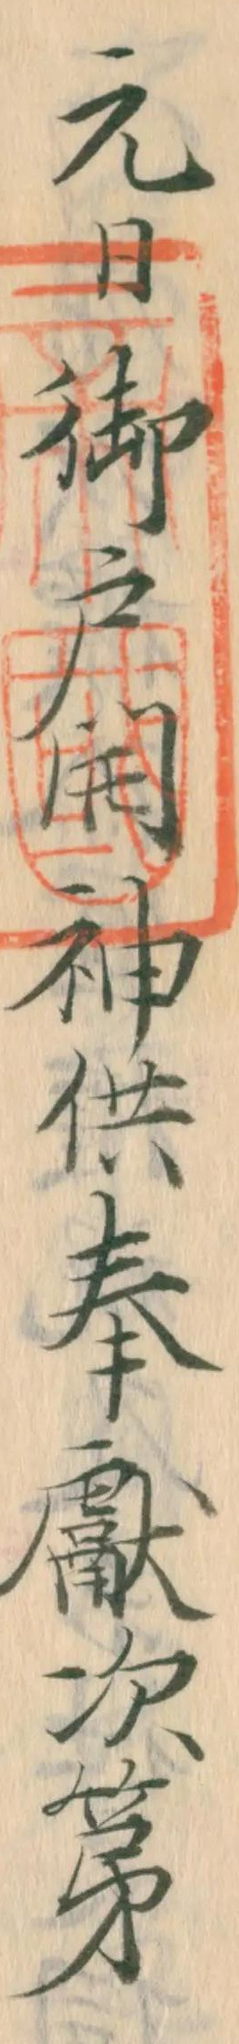元日御戸開神供奉献次第
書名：賀茂社記録. 第4冊
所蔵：国立国会図書館 National Diet Library, JAPAN
